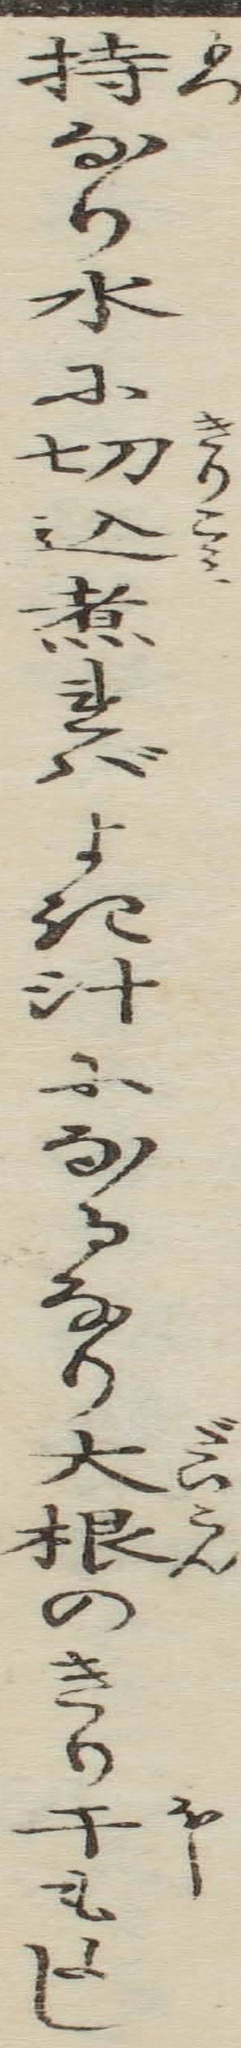持なり水に切込煮ればよき汁になるなり大根のきり干もよし
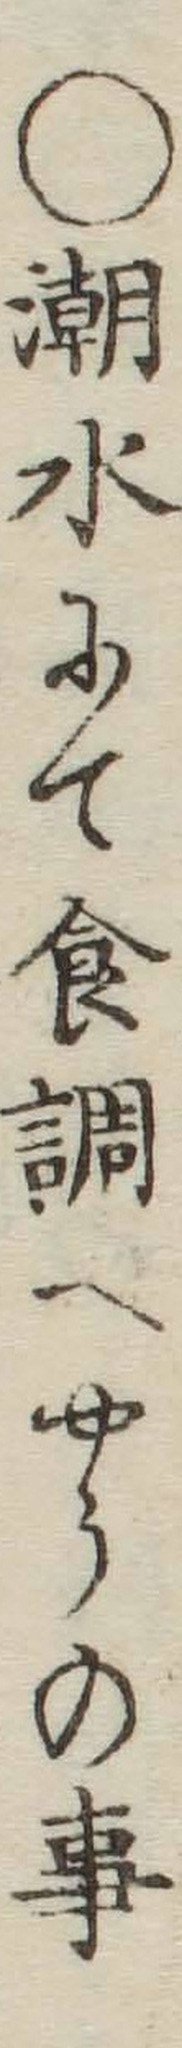○潮水にて食調へやうの事

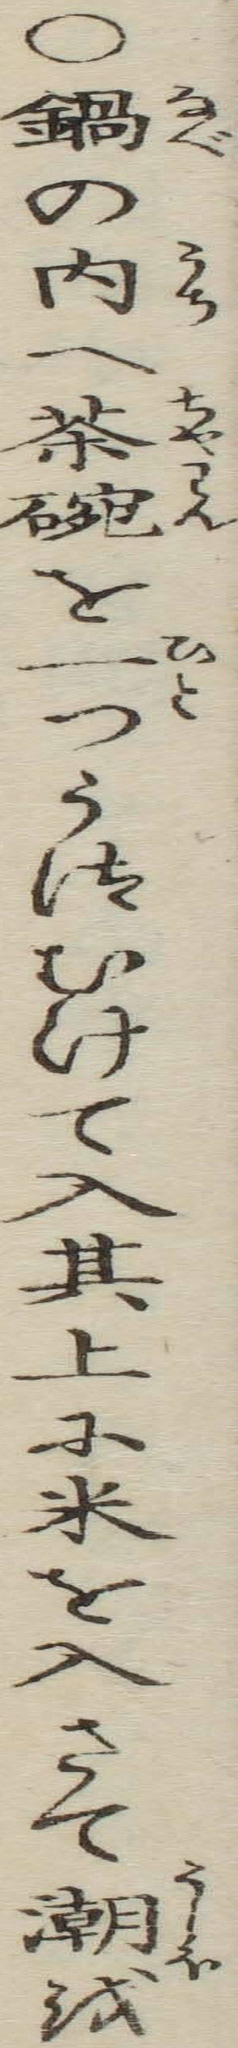○鍋の内へ茶碗を一つうつむけて入其上に米を入さて潮を
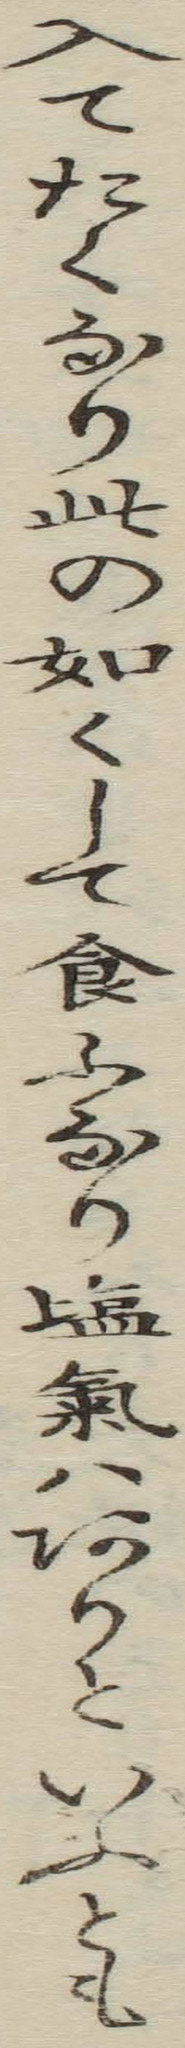入てたくなり此の如くして食ふなり塩気はありといふとも
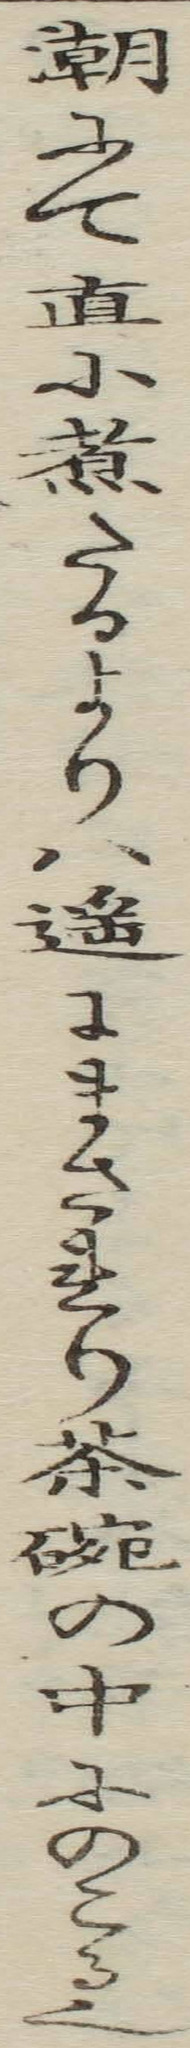潮にて直に煮たるよりは遥にまされり茶碗の中にのこる也
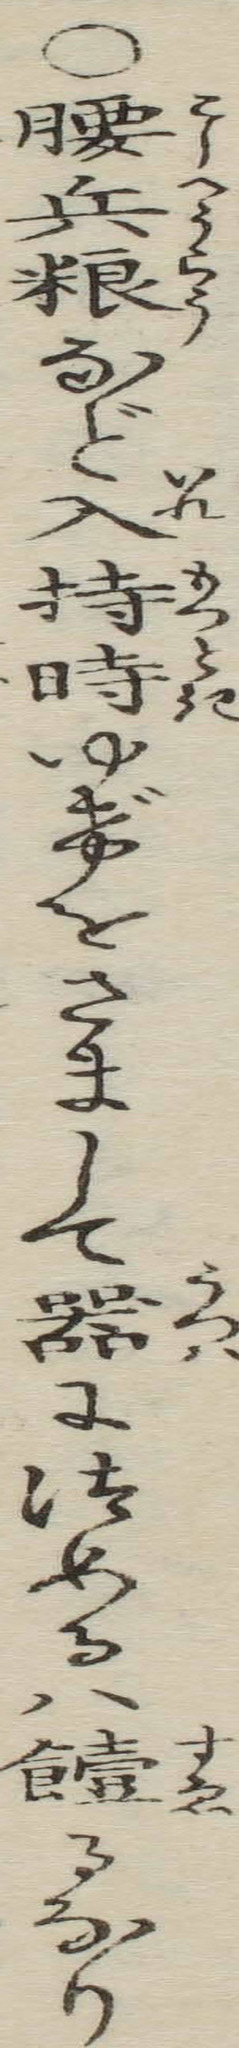○腰兵粮など入持時ゆげをさまして器につめるは饐るなり
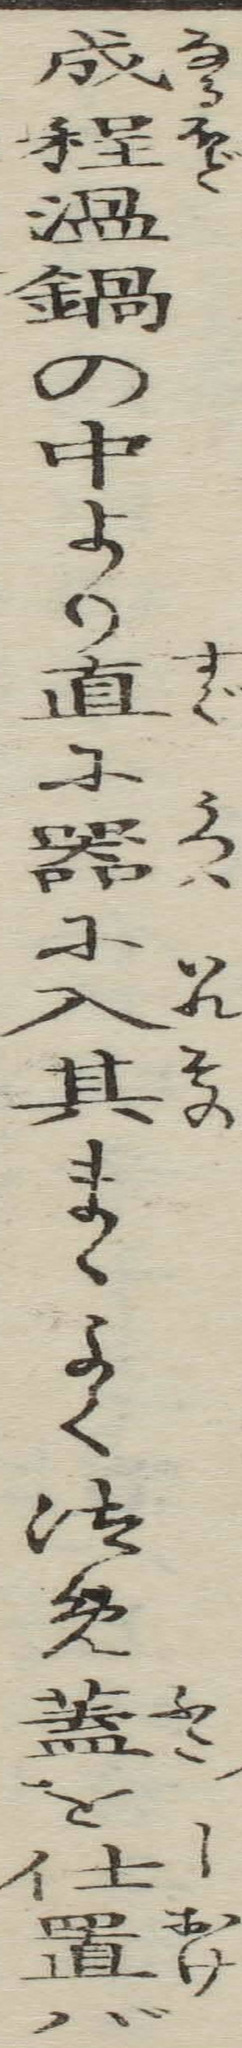成程温鍋の中より直に器に入其まゝよくつめ蓋を仕置ば
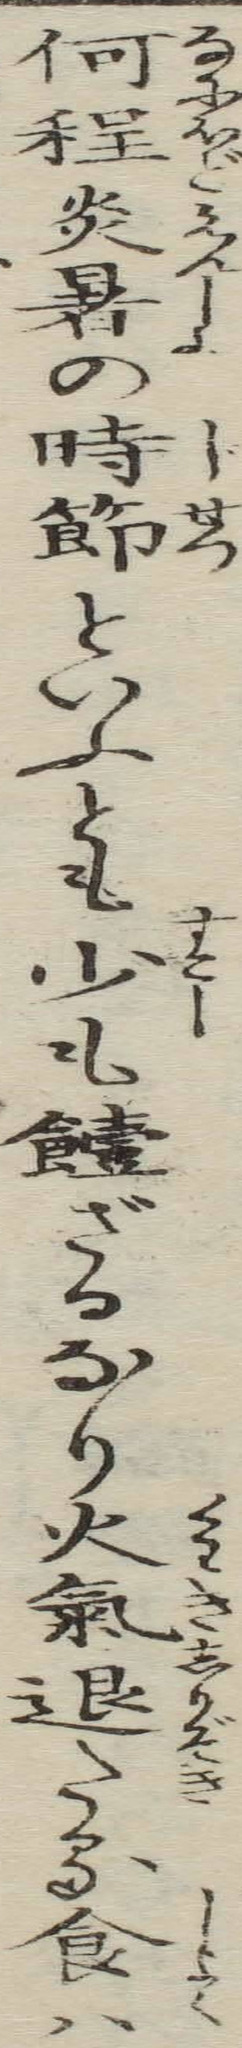何程炎暑の時節といふとも少も饐ざるなり火気退たる食は
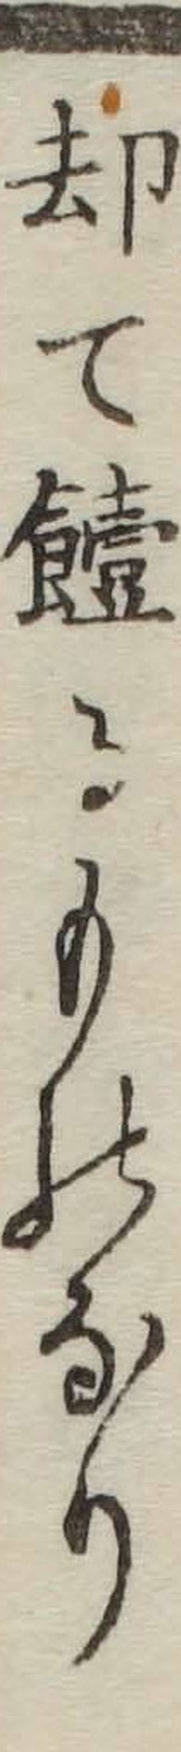却て饐るものなり
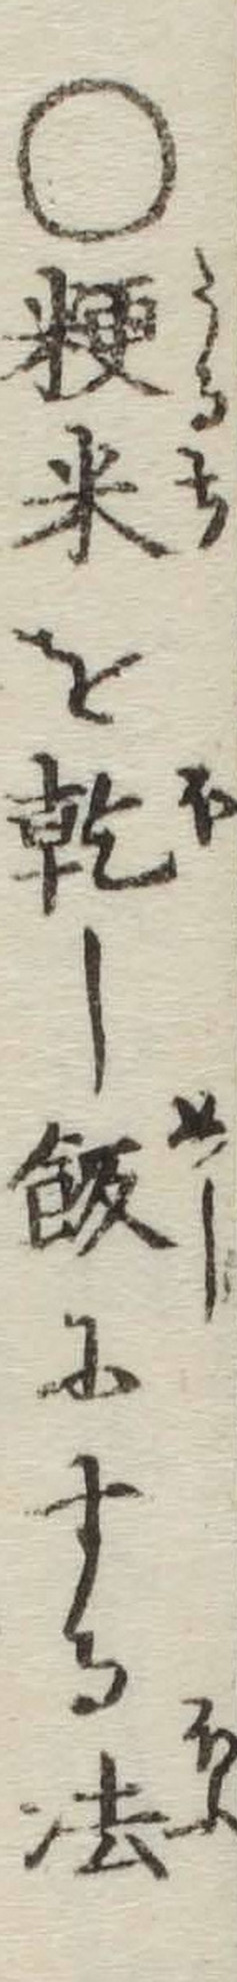○粳米を乾し飯にする法
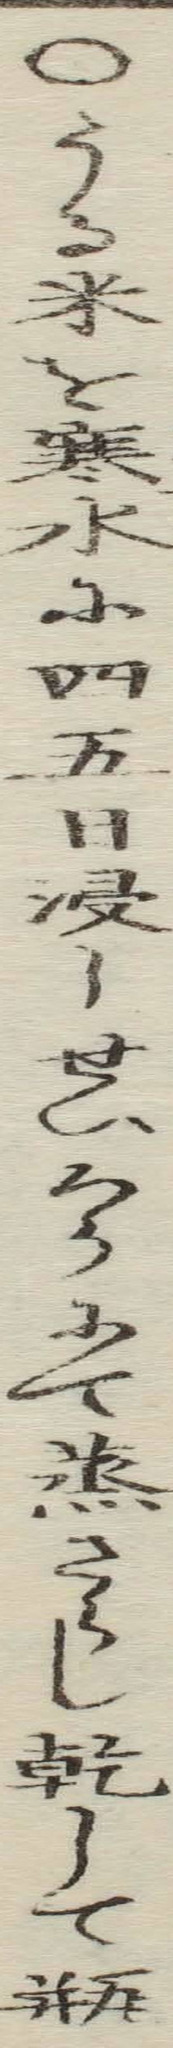○うる米を寒水に四五日浸しせいろうにて蒸さらし乾して瓶
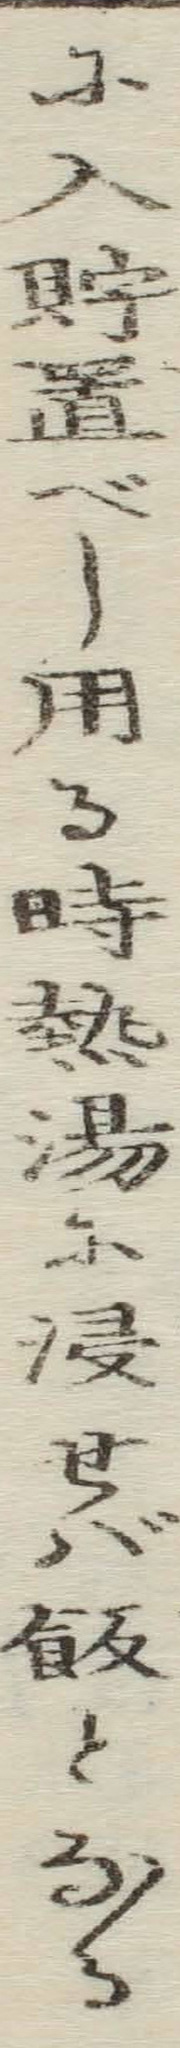に入貯置べし用る時熱湯に浸せば飯となる
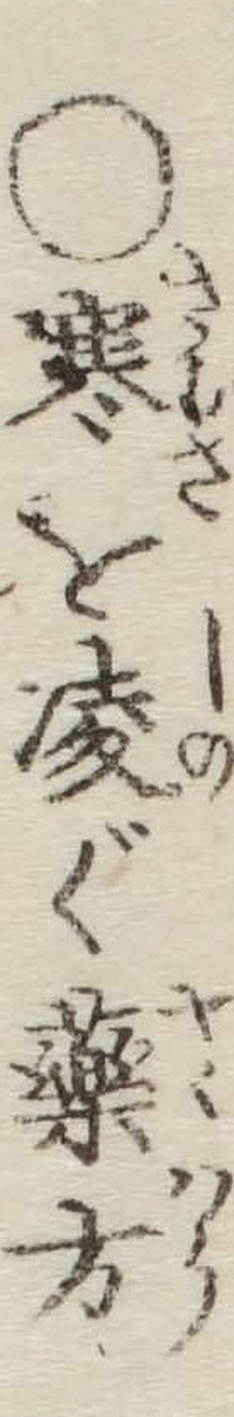○寒を凌ぐ薬方
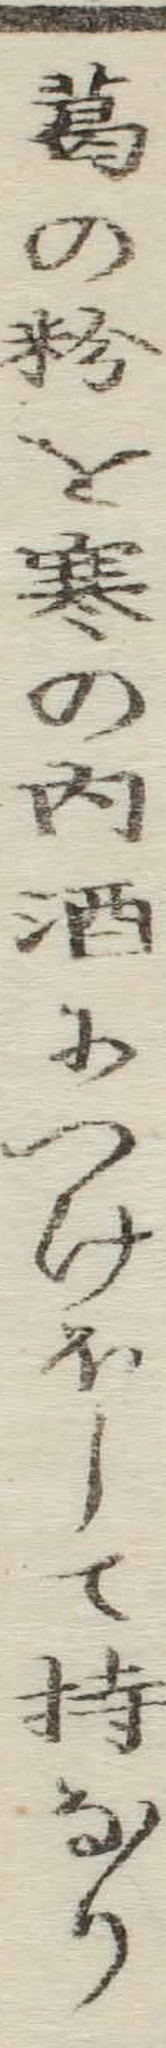葛の粉を寒の内酒につけほして持なり
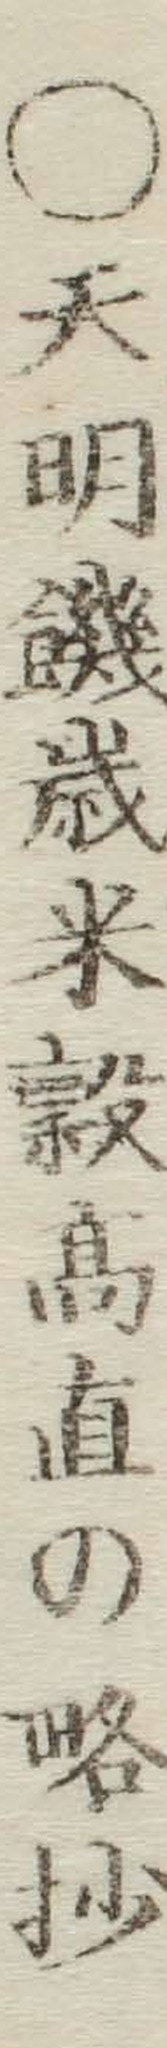○天明饑歳米穀高直の略抄
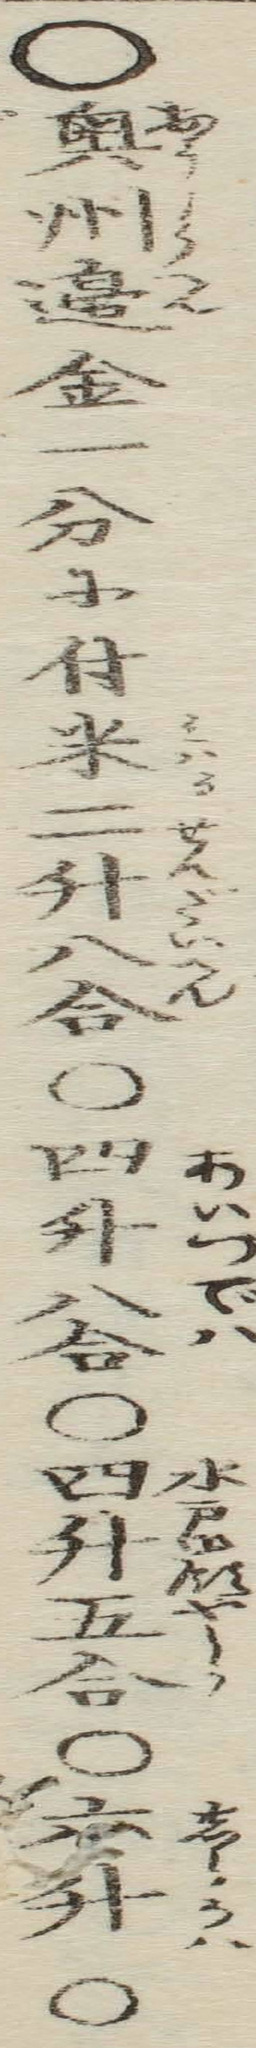○奥州辺金一分に付米二升八合○四升八合○四升五合○六升○
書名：救荒便覧
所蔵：国文学研究資料館
